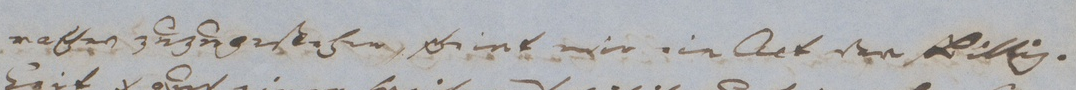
rathes zuzugestehen, scheint mir ein Act der Billig-
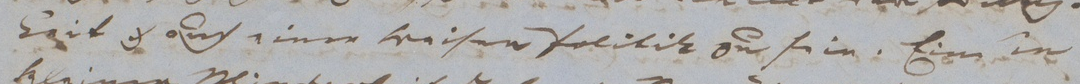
keit & auch einer weisen Politik zu sein. Eine in
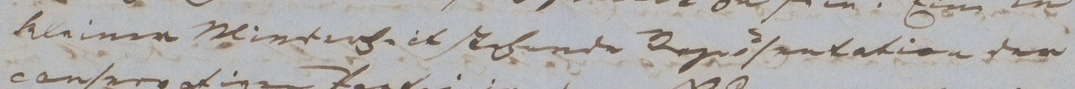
kleiner Minderheit stehende Repräsentation der
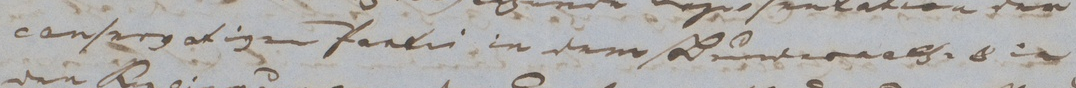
conservativen Partei in dem Bundesrathe & in
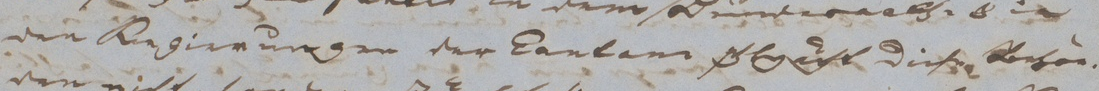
den Regierungen der Cantone schwächt diese Behör-
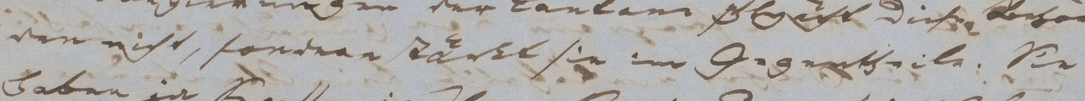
den nicht, sondern stärkt sie im Gegentheile. Sie
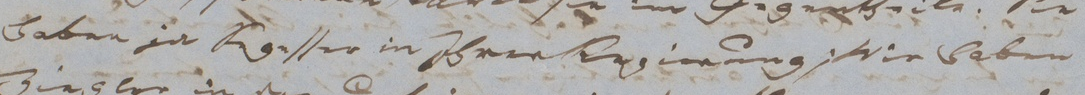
haben ja Segesser in Ihrer Regierung; wir haben
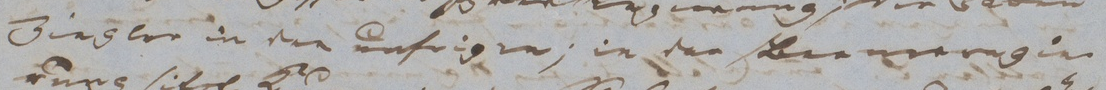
Ziegler in der unsrigen; in der Bernerregie-
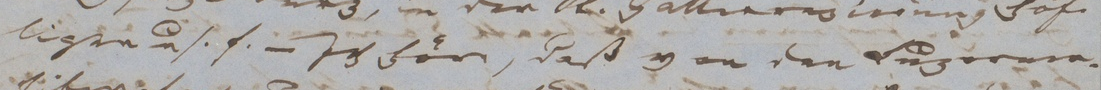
liger u. s. f. – Ich höre, daß von den Luzerner -
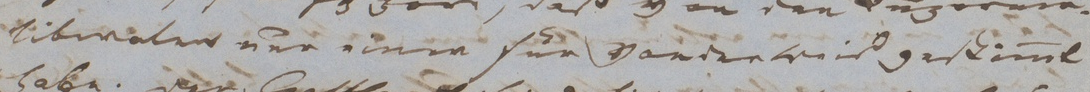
liberalen nur einer für Vonderweid gestimmt
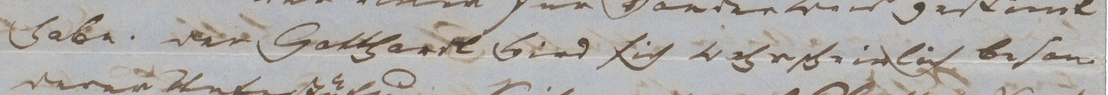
habe. Der Gotthardt wird sich wahrscheinlich beson-
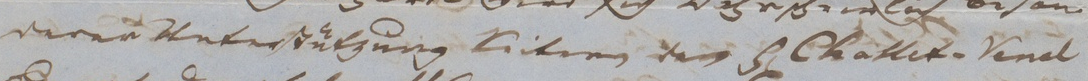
derer Unterstützung Seitens des Hrn. Challet-Venel
